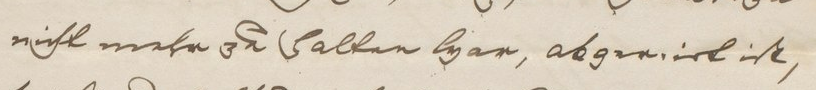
nicht mehr zu halten war, abgereist ist,
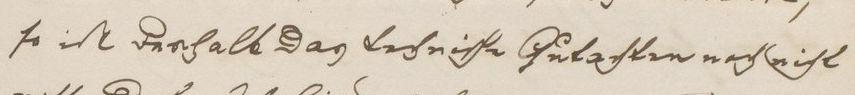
so ist deshalb das technische Gutachten noch nicht
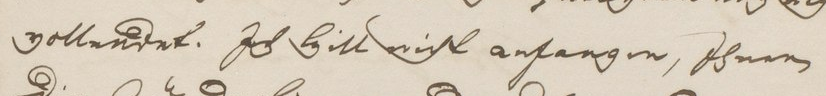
vollendet. Ich will nicht anfangen, Ihnen
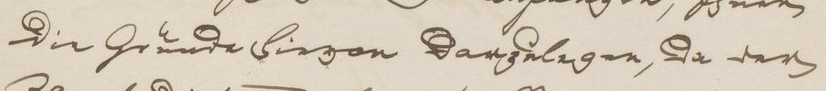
die Gründe hievon darzulegen, da der
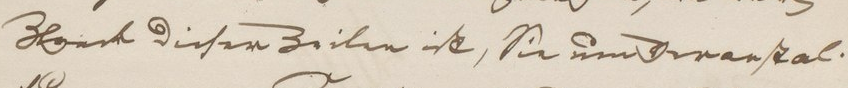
Zweck dieser Zeilen ist, Sie um Veranstal-
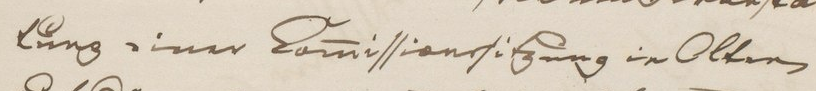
tung einer Commissionssitzung in Olten
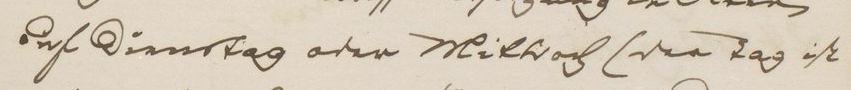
auf Dienstag oder Mittwoch (der Tag ist
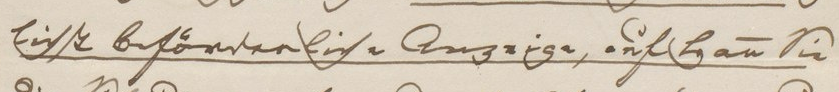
lichst beförderliche Anzeige, auf wann Sie
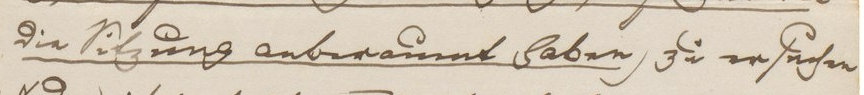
die Sitzung anberaunt haben) zu ersuchen
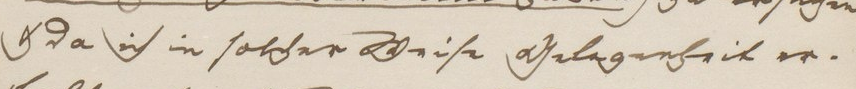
& da ich in solcher Weise Gelegenheit er-
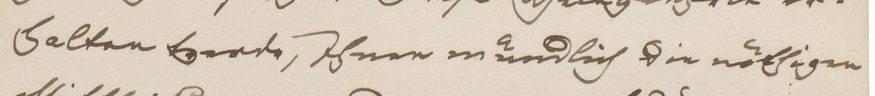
halten werde, Ihnen mündlich die nöthigen
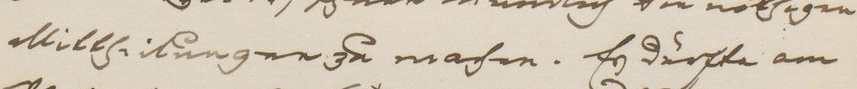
Mittheilungen zu machen. Es dürfte am
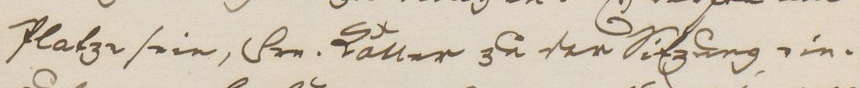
Platze sein, Hrn. Koller zu der Sitzung ein-
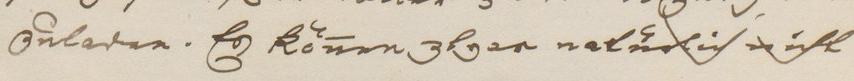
zuladen. Es können zwar natürlich nicht
